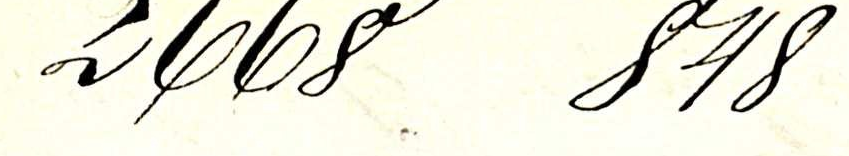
2668 [1]848
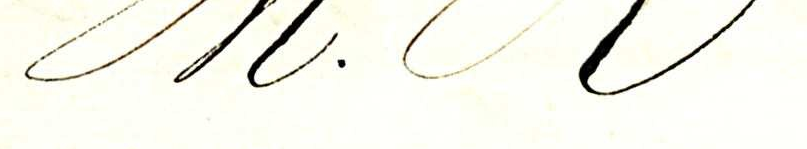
MR
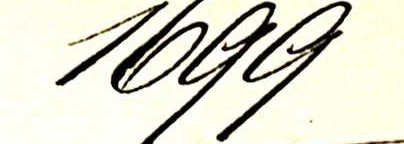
1699
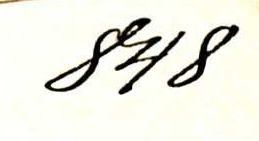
848
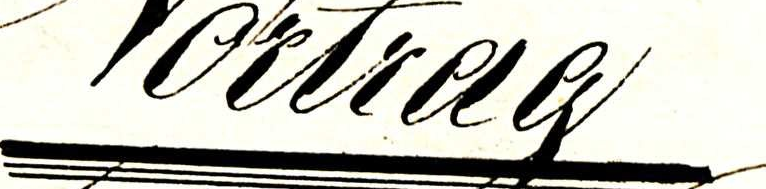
Vortrag
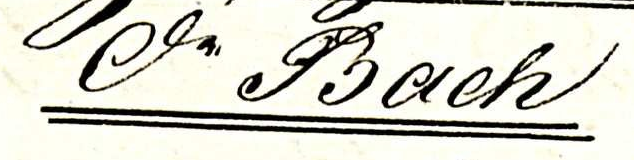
Dr Bach
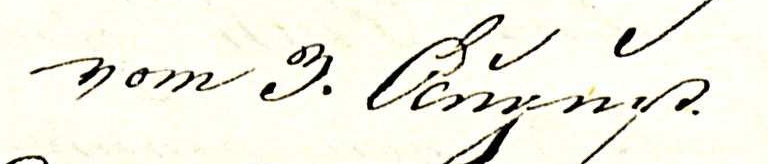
vom 3. August
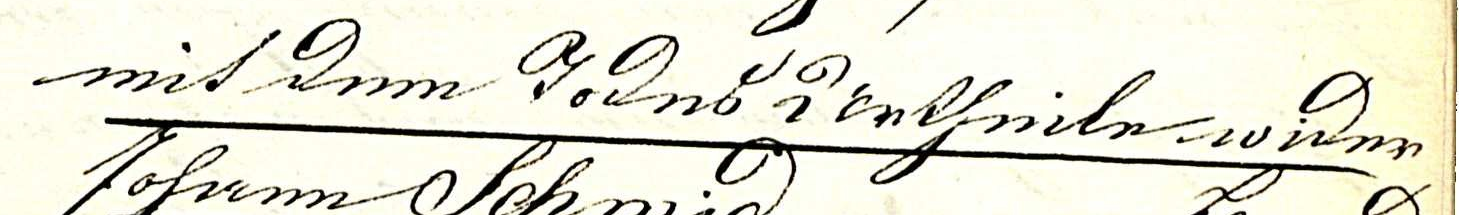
mit dem Todes Urtheile wider
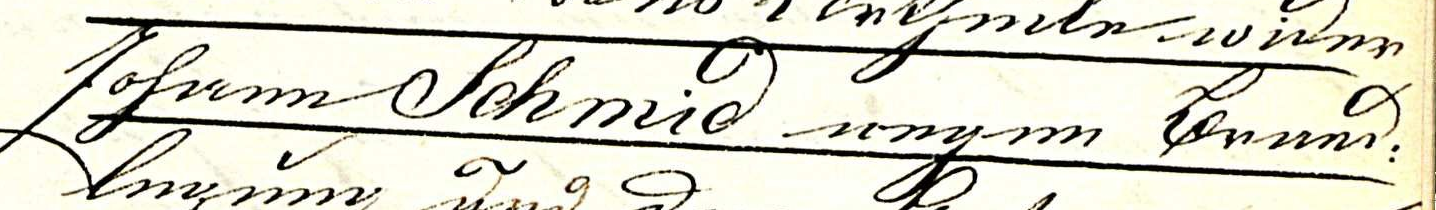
Johann Schmid wegen Brand¬
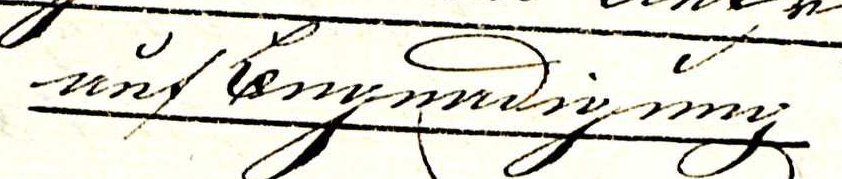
auf Begnadigung
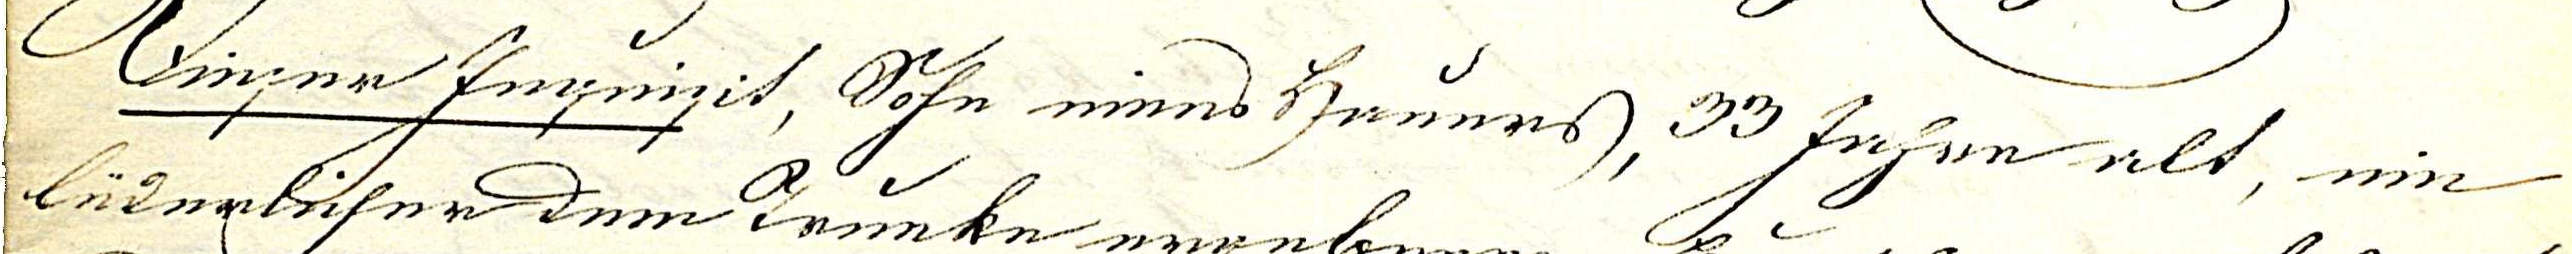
Dieser Inquisit, Sohn eines Hauers, 33 Jahre alt, ein
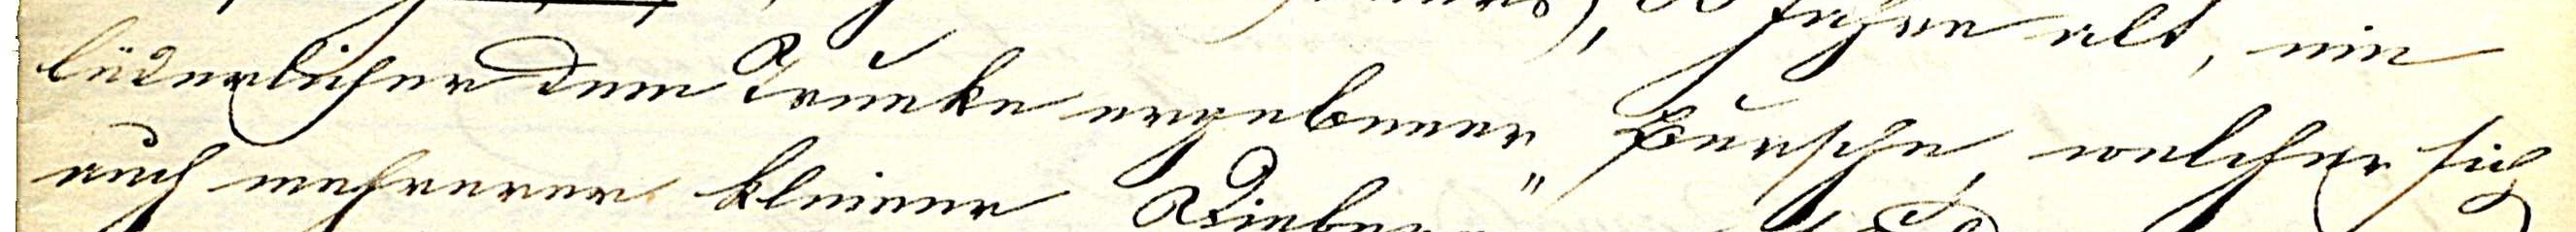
lüderlicher [liederlich]dem Trunke ergebener Bursche, welcher sich
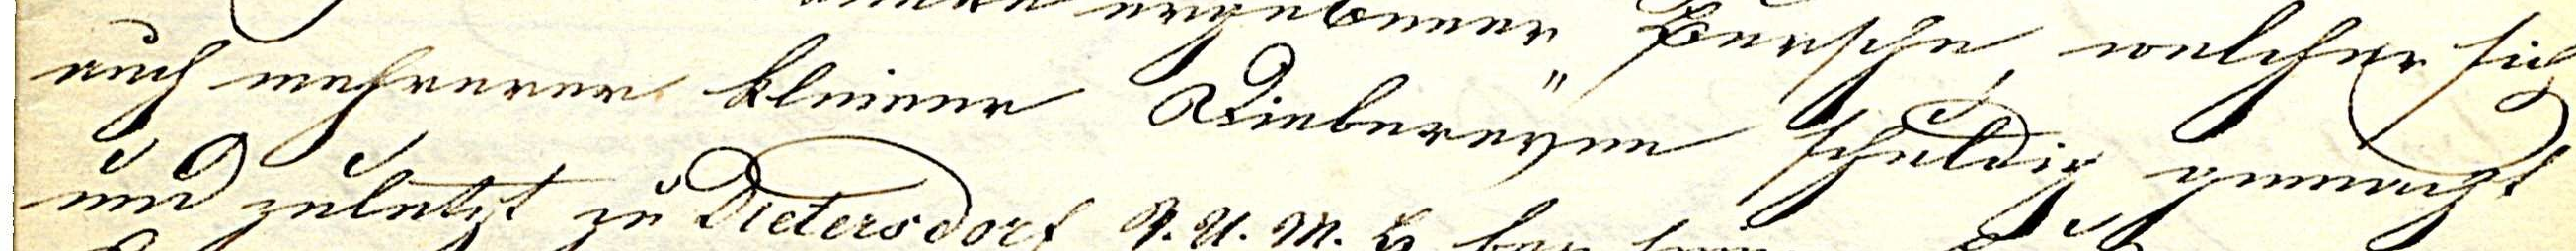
auch mehrerer kleiner Diebereyen schuldig gemacht
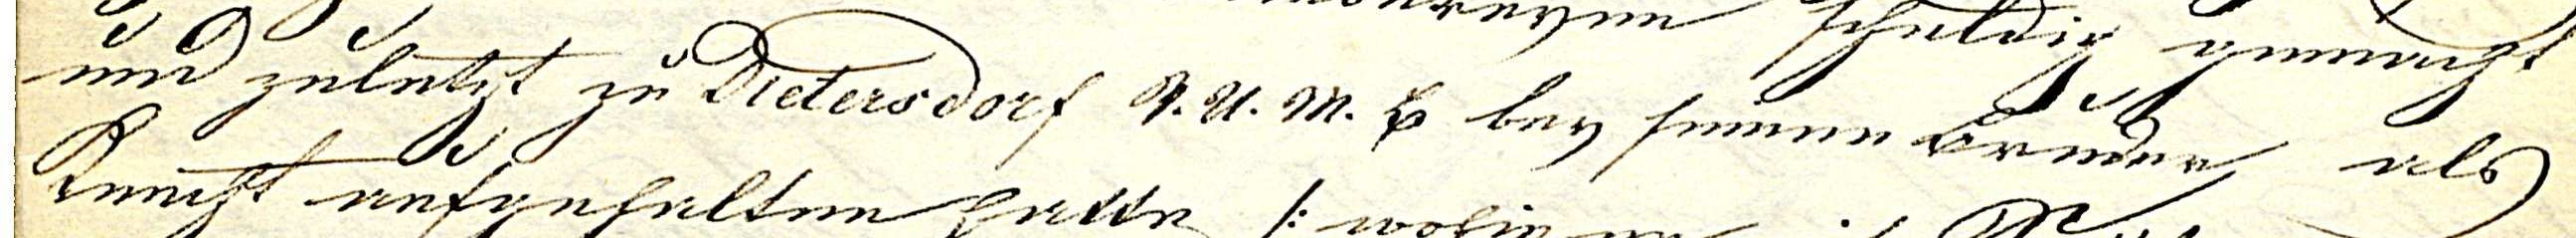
und zuletzt zu Dietersdorf V.U.M.B. bey seinen Bruder als
